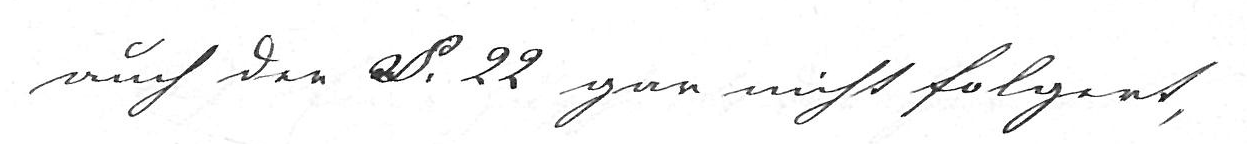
auch der § 22 gar nicht folgert,
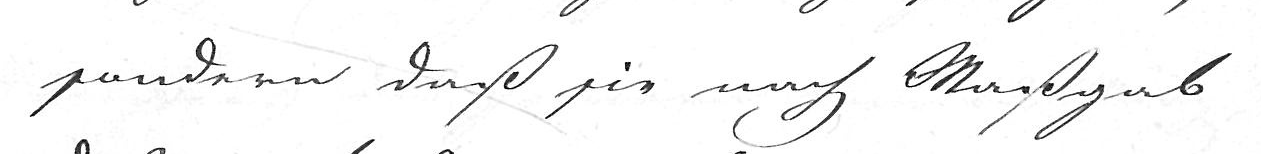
sondern daß sie nach Maßgab
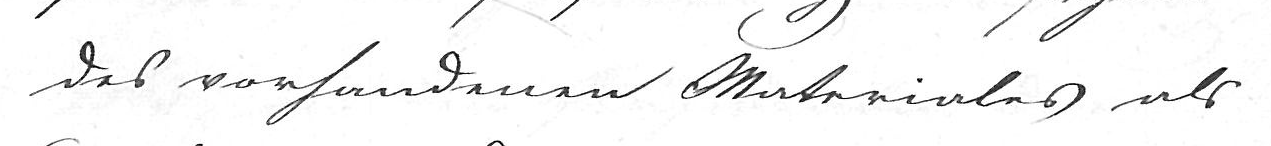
des vorhandenen Materiales als
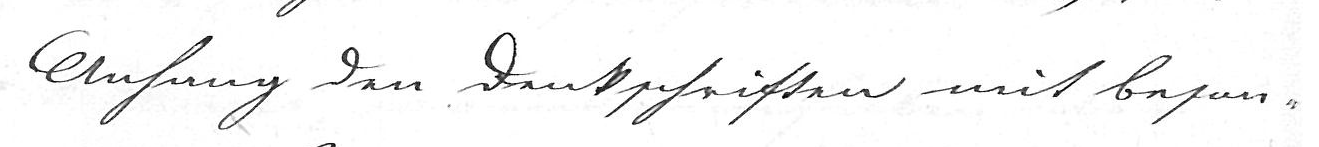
Anhang den Denkschriften mit beson-
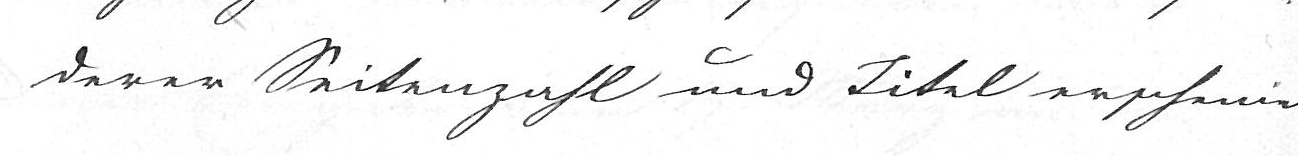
derer Seitenzahl und Titel erscheine.
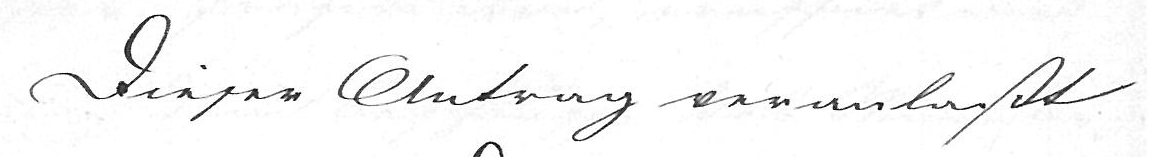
Dieser Antrag veranlaßt
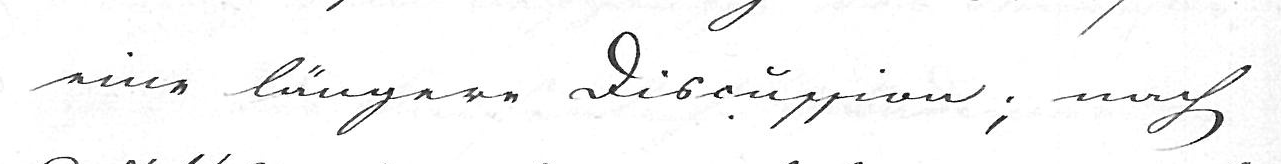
eine längere Discussion; nach
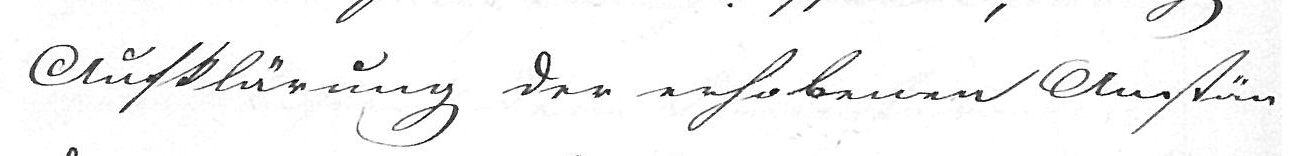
Aufklärung der erhobenen Anstän-
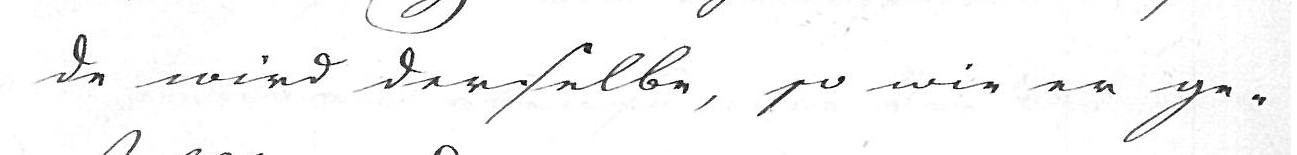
de wird derselbe, so wie er ge-
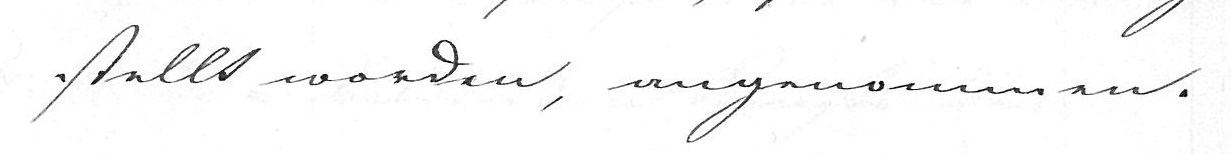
stellt worden, angenommen.
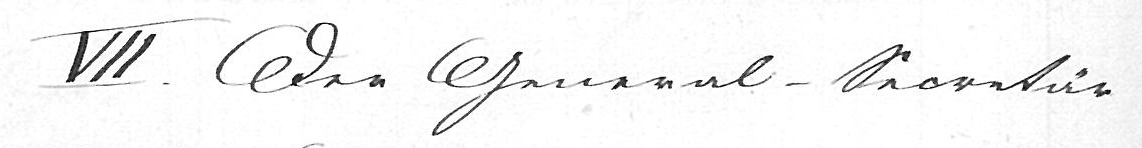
VII. Der General-Secretär
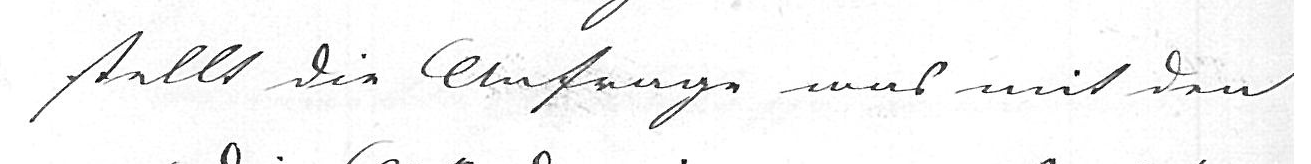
stellt die Anfrage was mit den
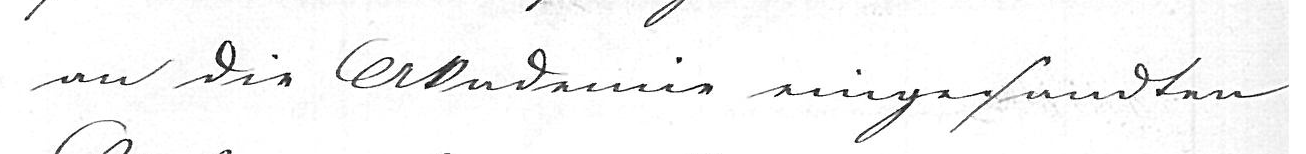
an die Akademie eingesandten
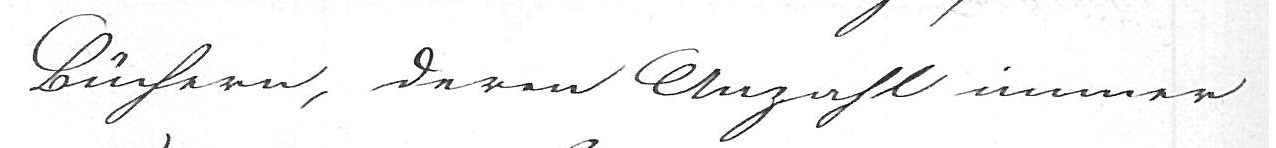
Büchern, deren Anzahl immer
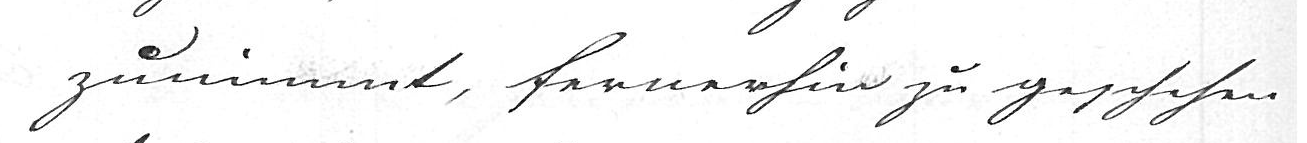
zunimmt, fernerhin zu geschehen
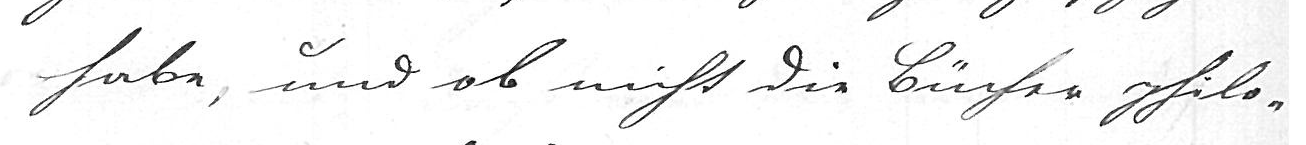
habe, und ob nicht die Bücher philo-
